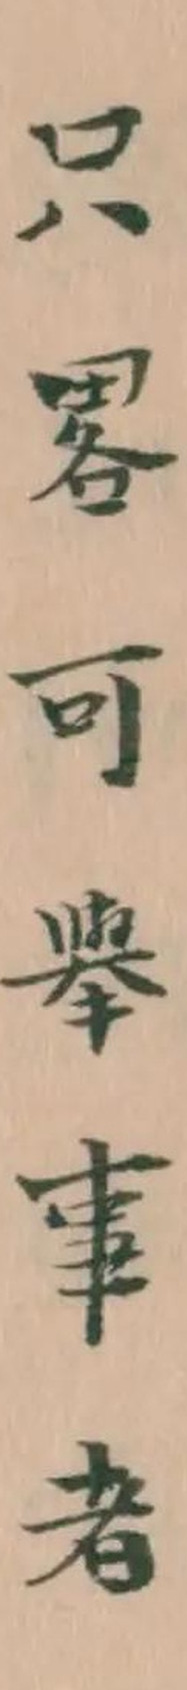只略可挙事者
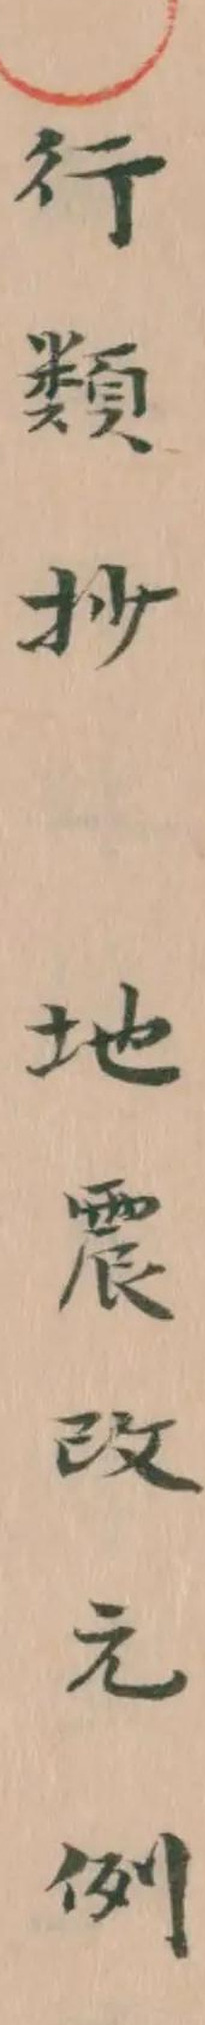○行類抄地震改元例
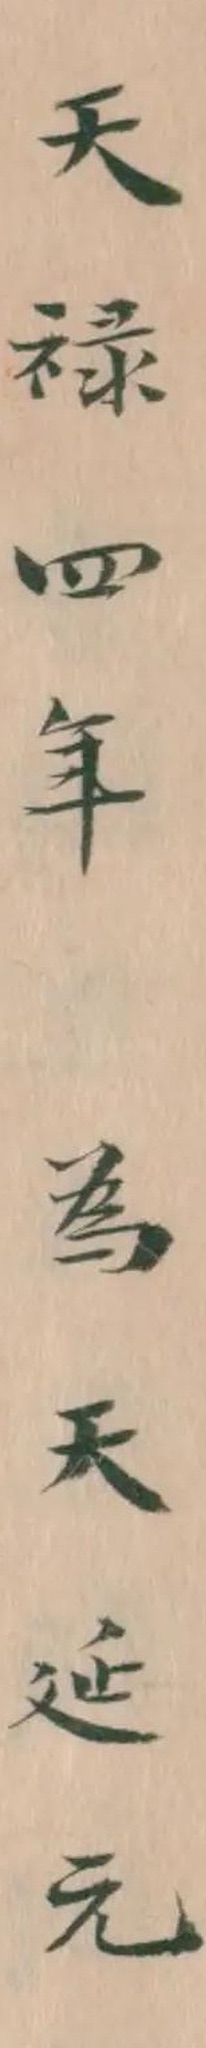天禄四年為天延元
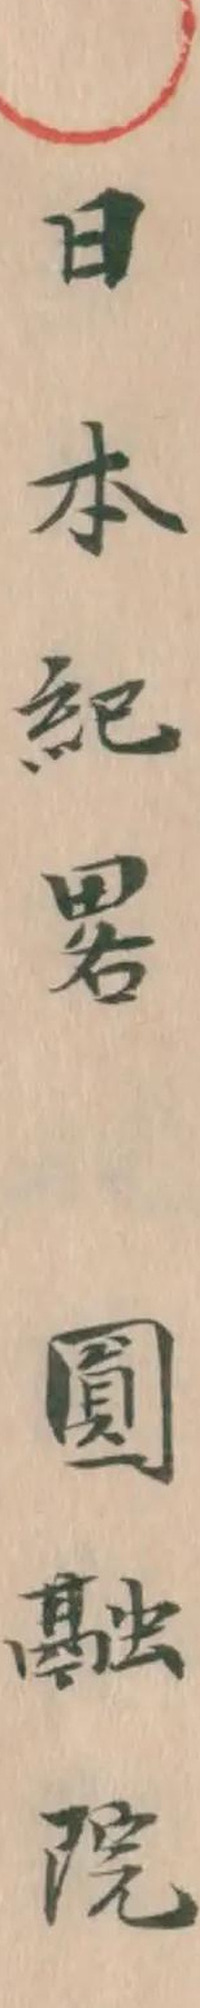○日本紀略円融院
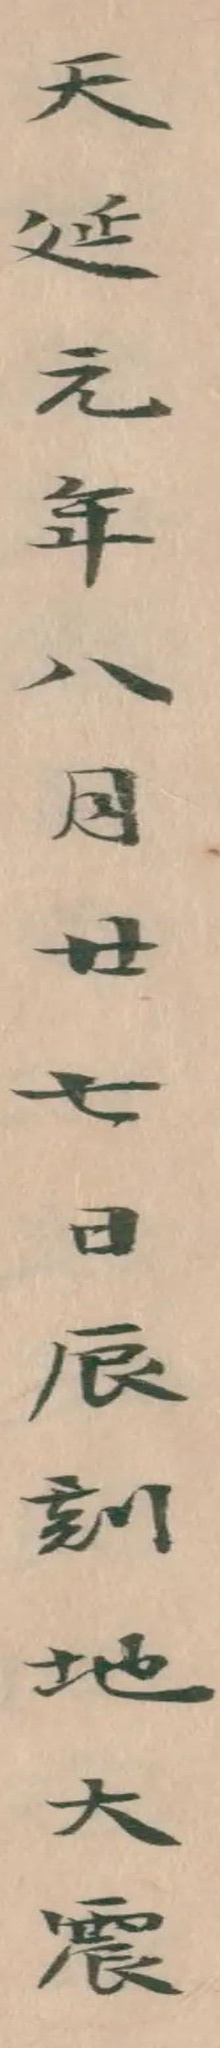天延元年八月廿七日辰刻地大震
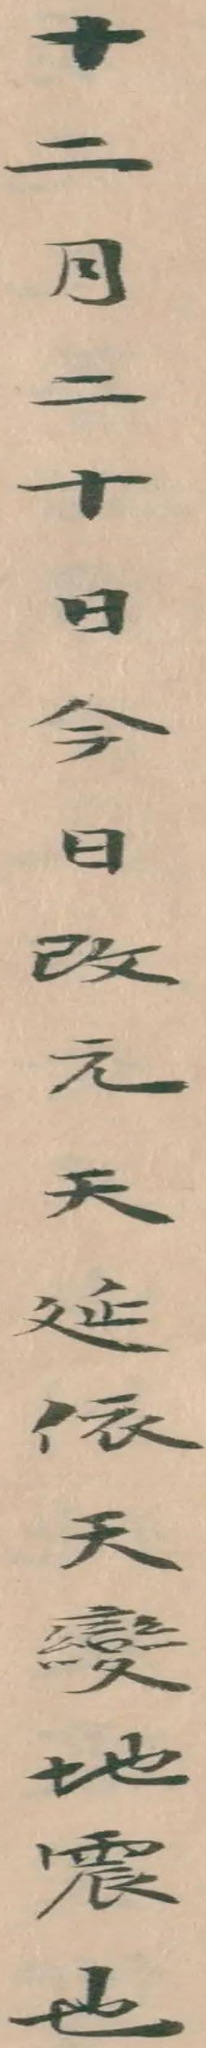十二月二十日今日改元天延依天変地震也
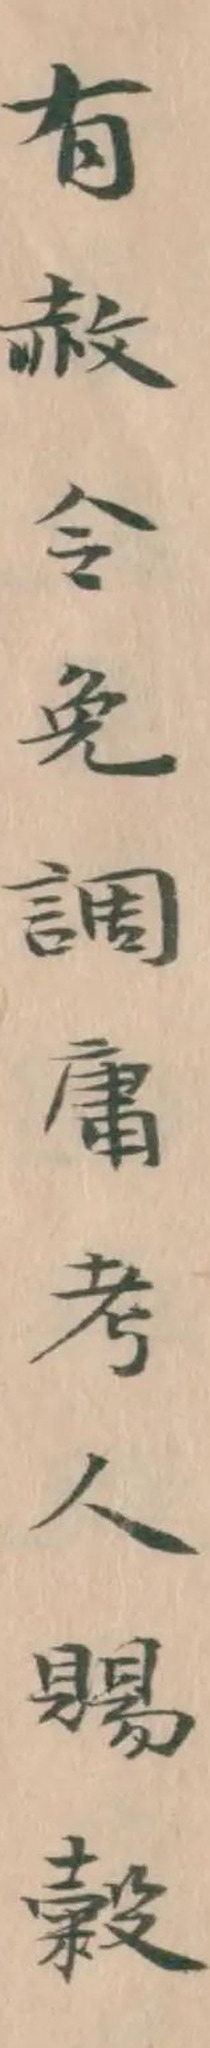有赦令免調庸考人賜穀

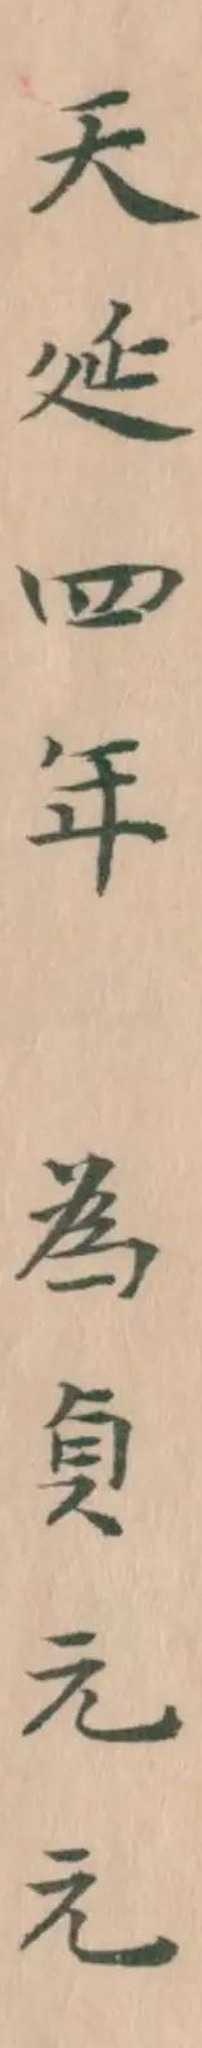天延四年為貞元元
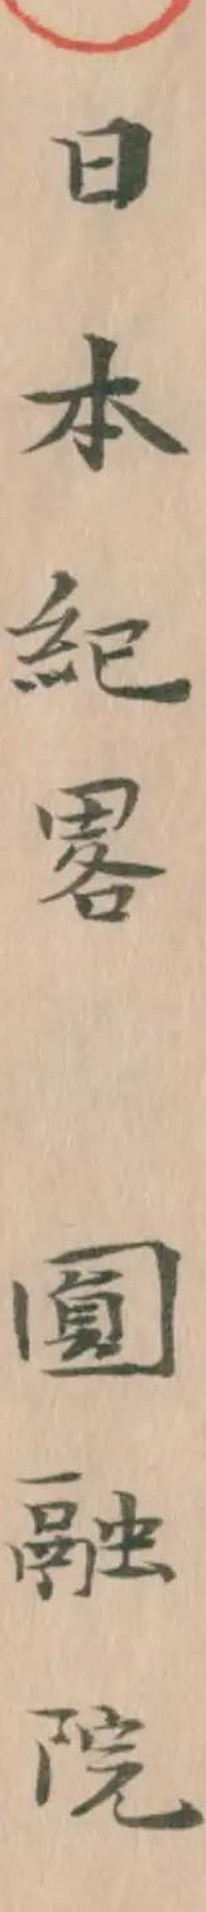○日本紀略円融院
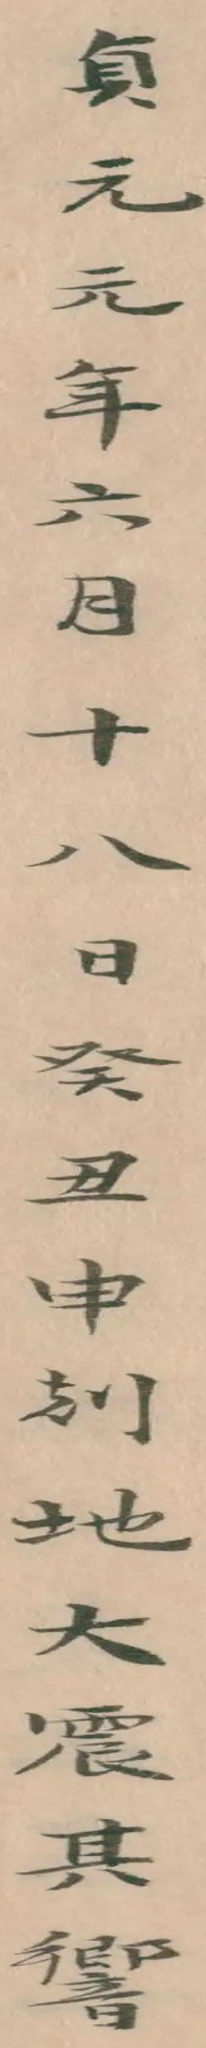貞元元年六月十八日癸丑申刻地大震其響
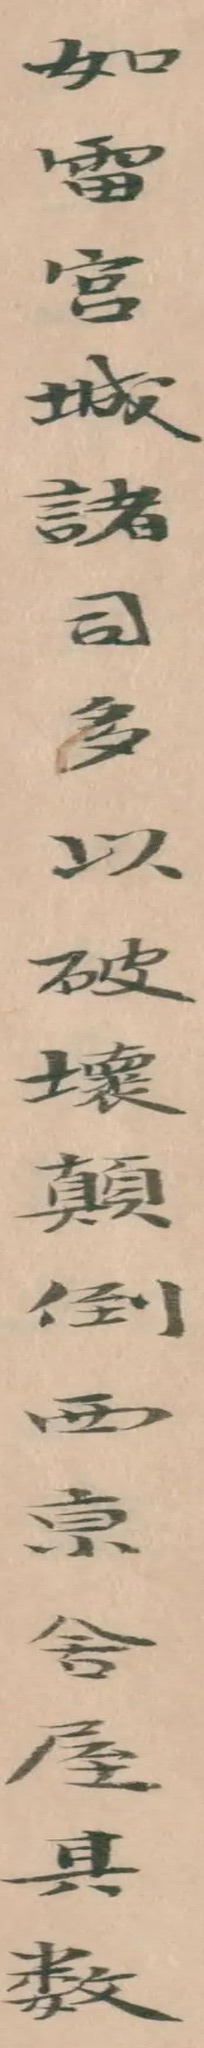如雷宮城諸司多以破壊顛倒西京舎屋其数
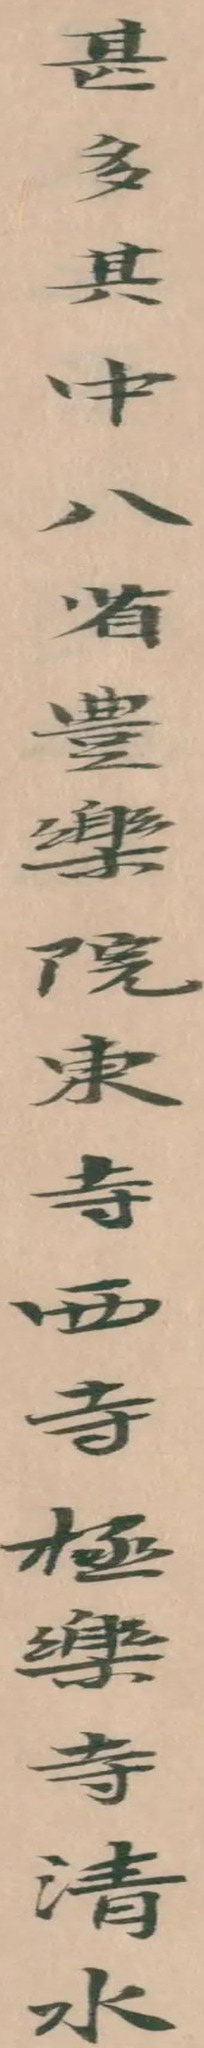甚多其中八省豊楽院東寺西寺極楽寺清水
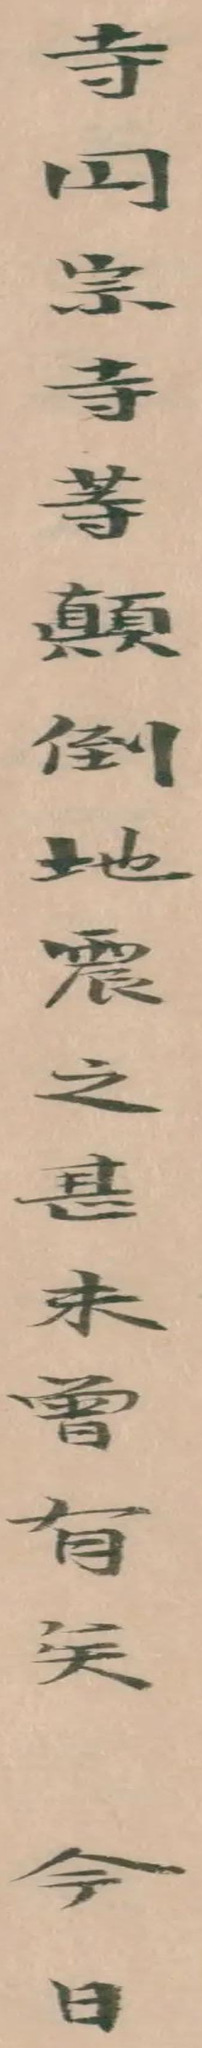寺円宗寺等顛倒地震之甚未曽有矣今日
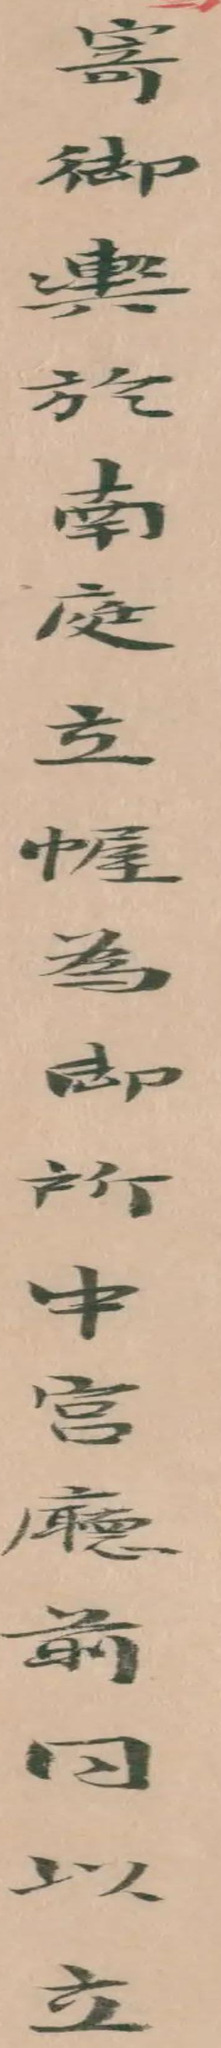寄御輿於南庭立幄為御所中宮庁前同以立
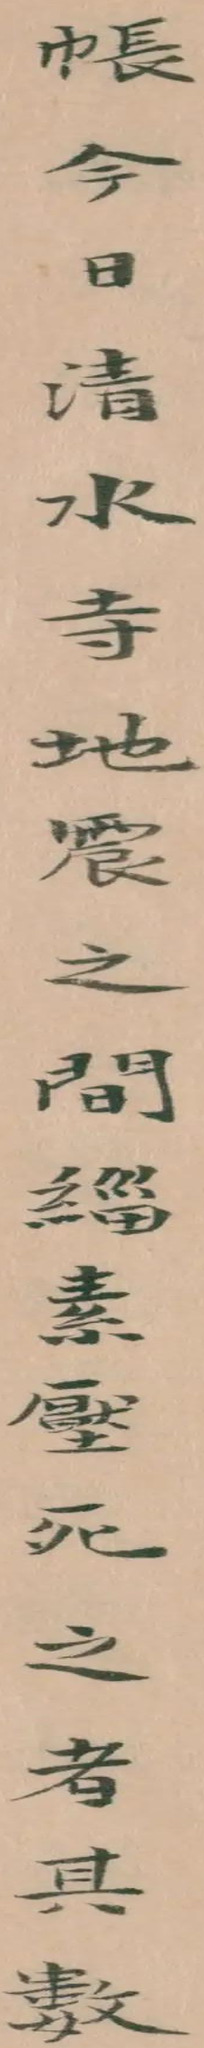帳今日清水寺地震之間緇素圧死之者其数
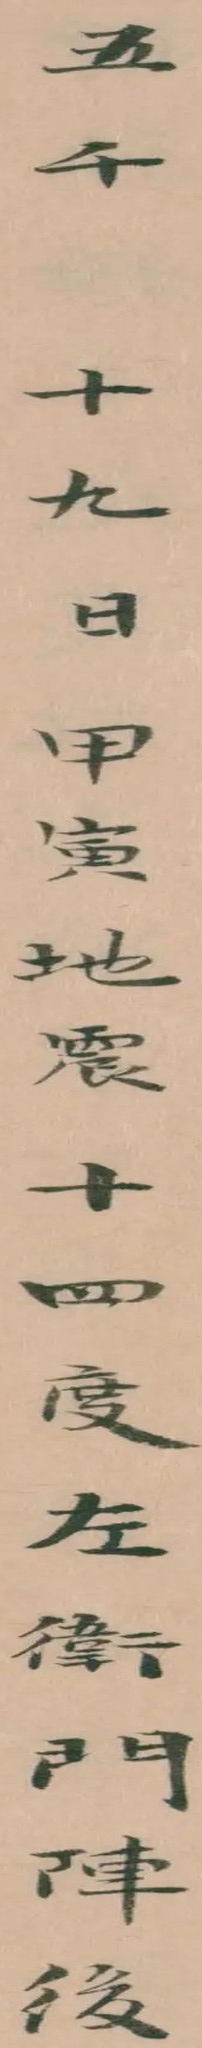五千十九日甲寅地震十四度左衛門陣後
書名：地災撮要. 巻5-6(地震之部)
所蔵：国立国会図書館 National Diet Library, JAPAN
